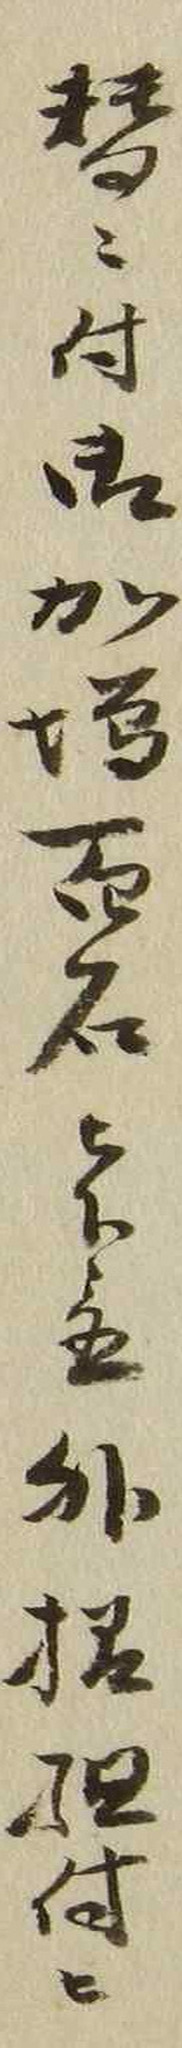替ニ付御加増百石被下置外様組付被
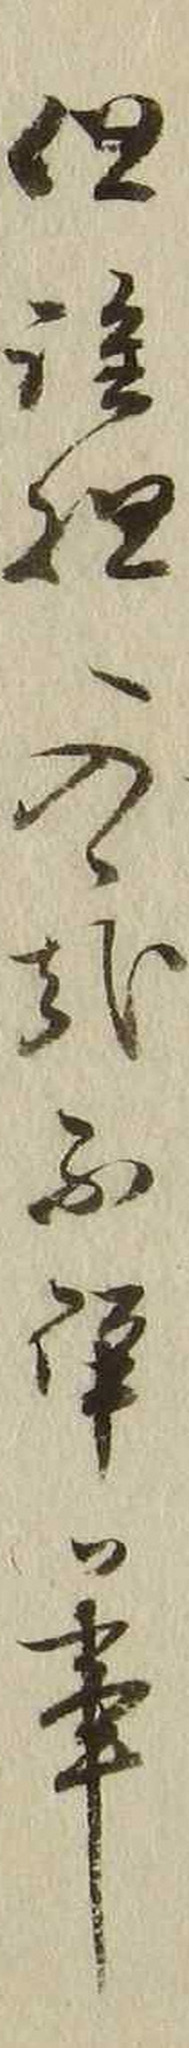但誰組へ入候哉不詳候事
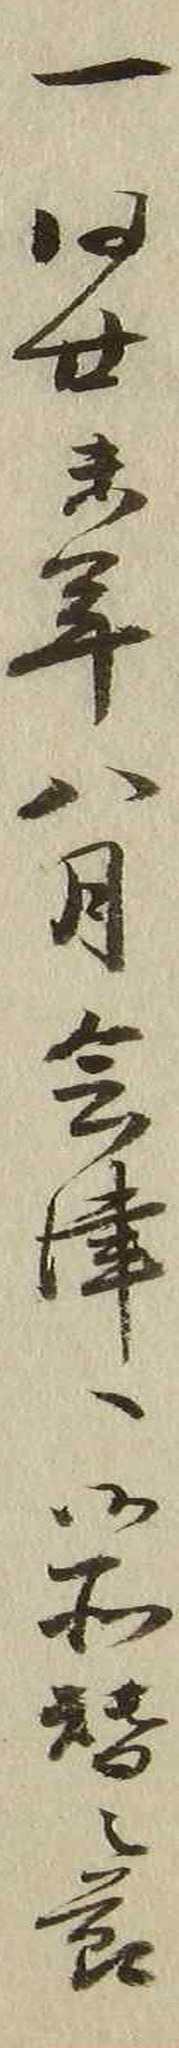一同廿未年八月会津へ御所替之節
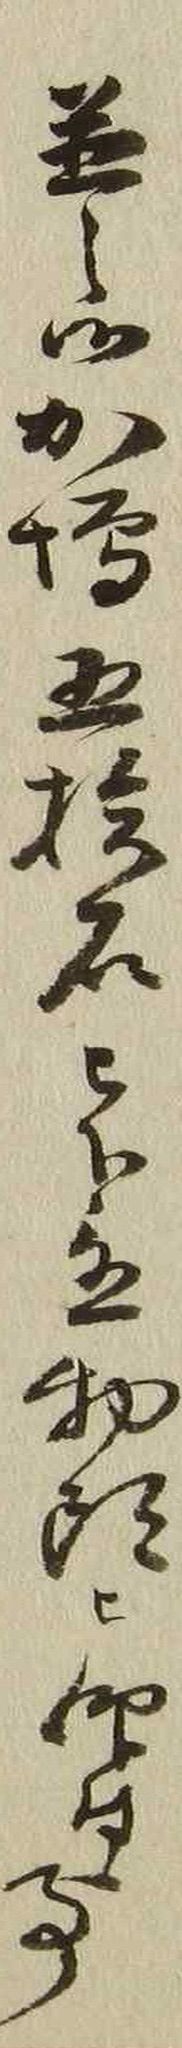並之御加増五拾石被下置物頭被仰付候事
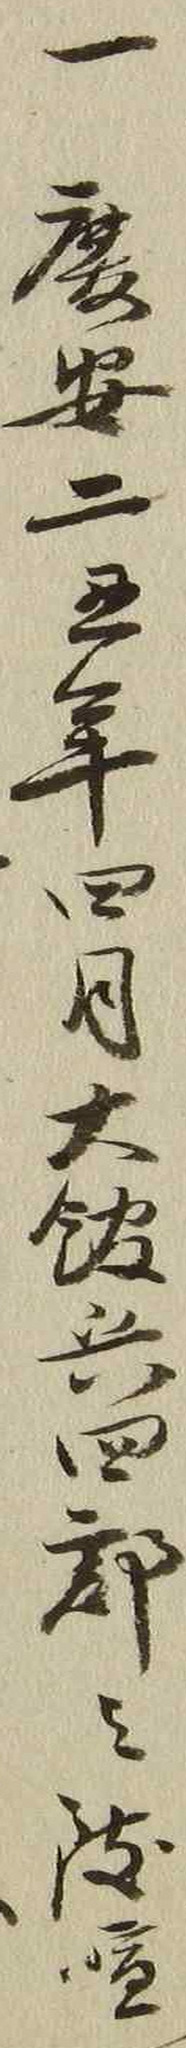一慶安二丑年四月大館兵四郎と致ニ喧
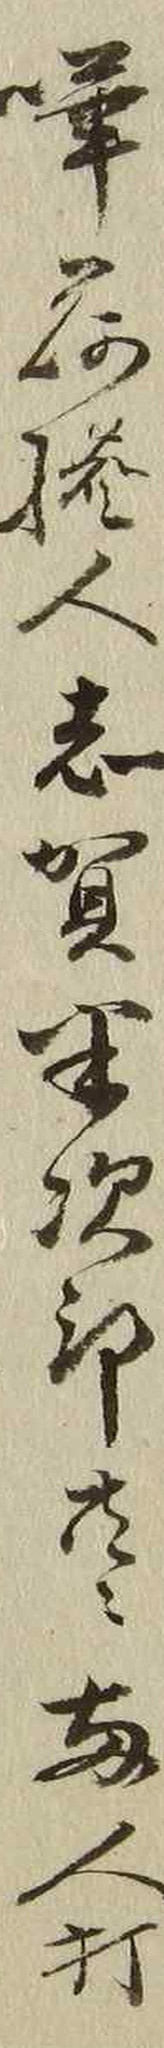嘩荷擔人志賀半次郎共々両人打
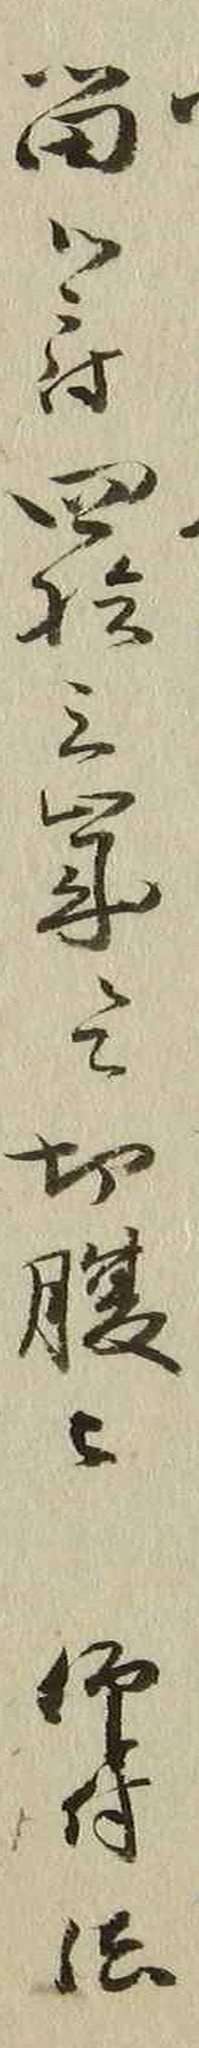留候ニ付四十三歳ニて切腹被仰付法
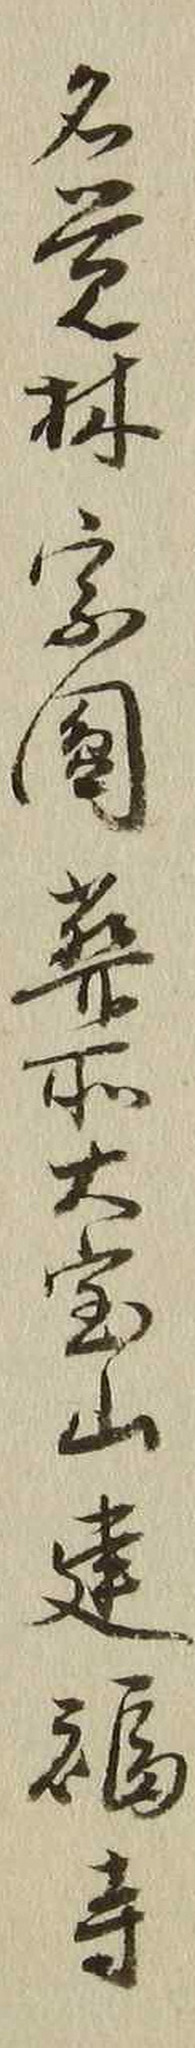名覚林宗円葬所大宝山建福寺
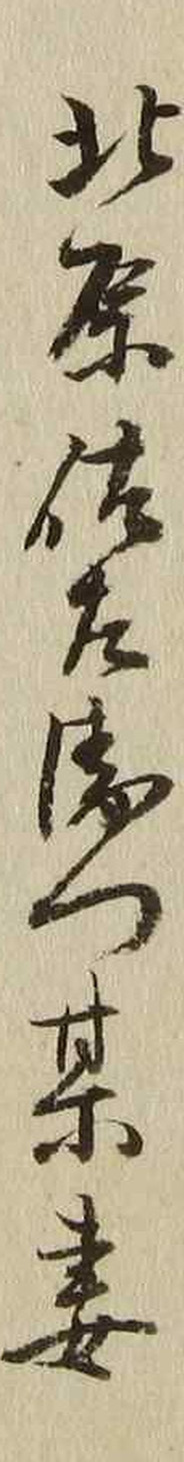女北原佐左衛門某妻
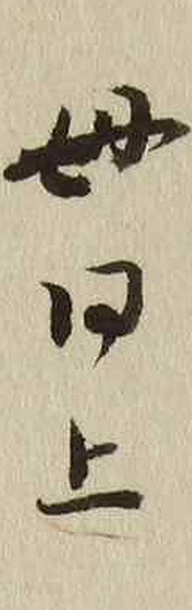母同上
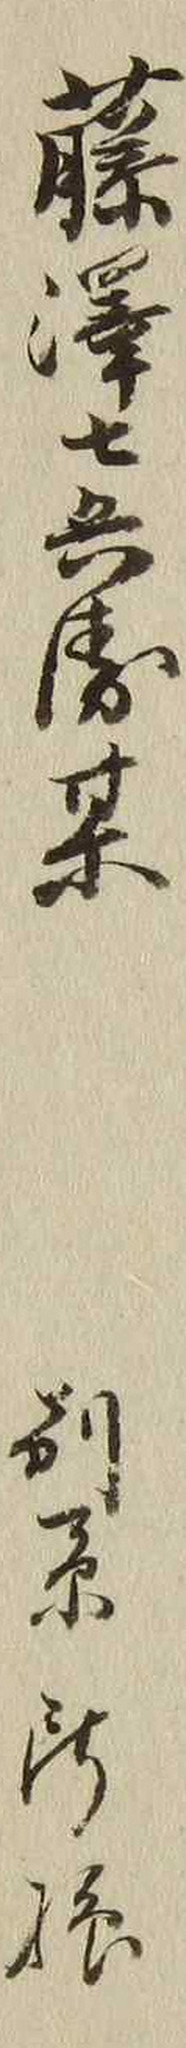藤沢七兵衛某別系断絶
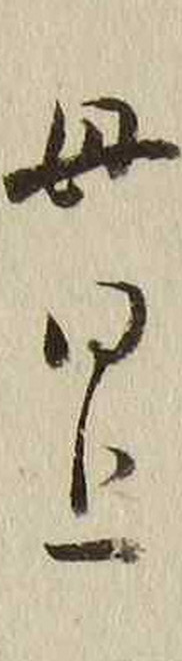母同上
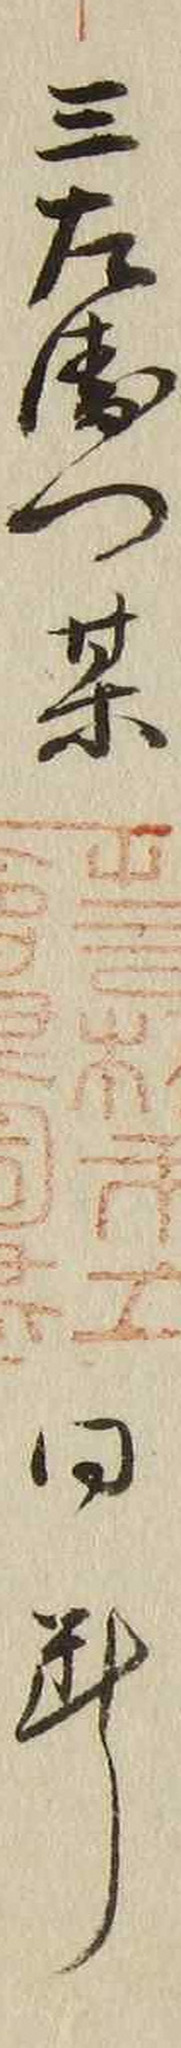三左衛門某同断

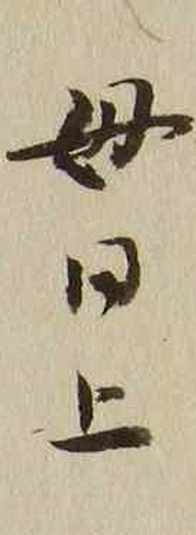母同上
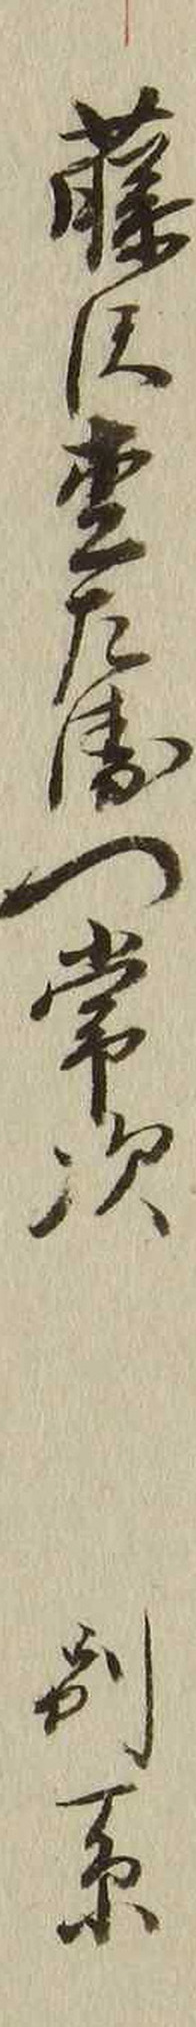藤沢杢左衛門常次別系
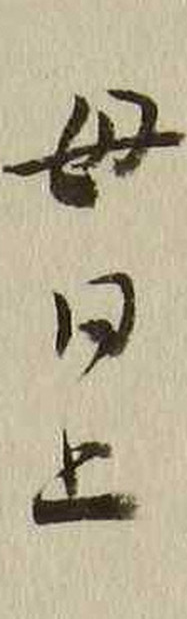母同上
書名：諸士系譜　巻之236　ふ之部4
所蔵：会津若松市立会津図書館
